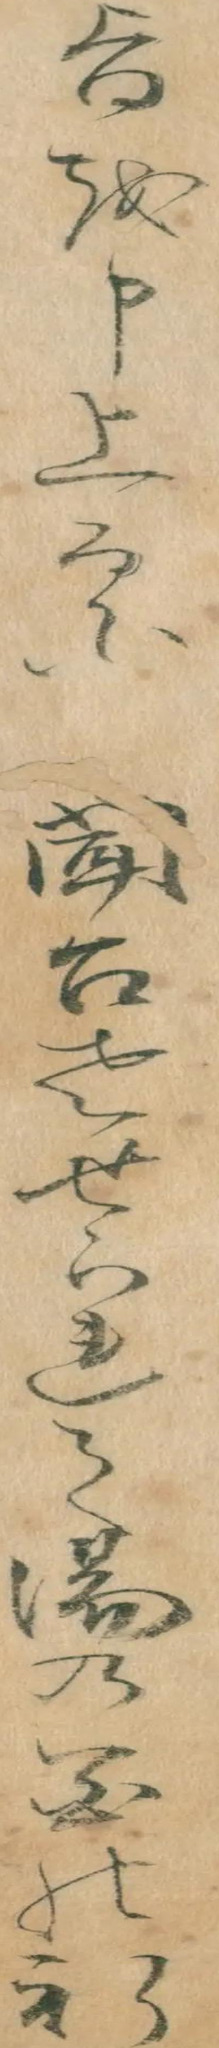旨を申上るに聞召をさせられて湯の花の祈
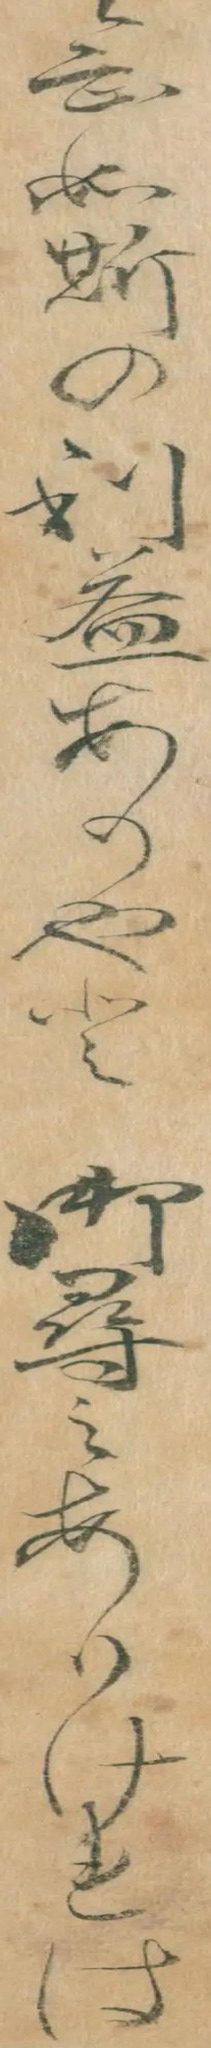念如斯の利益ありやと御尋のありけれは

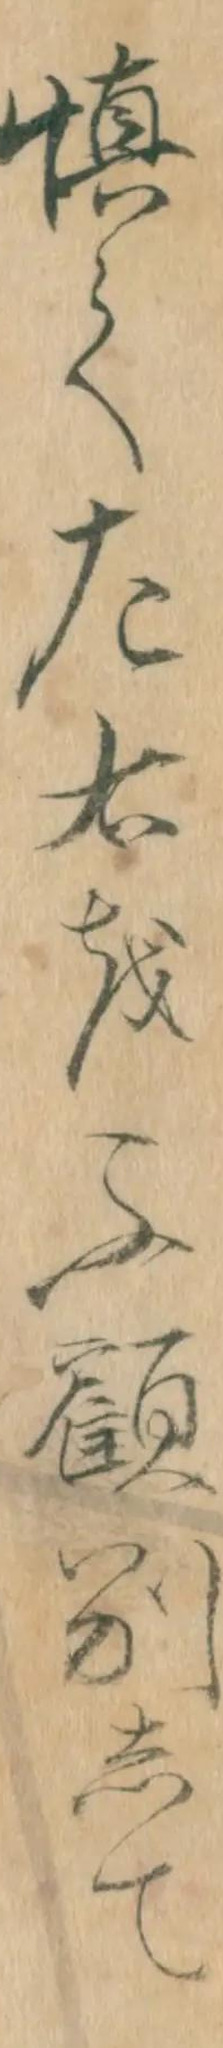慎て左右を不顧別して
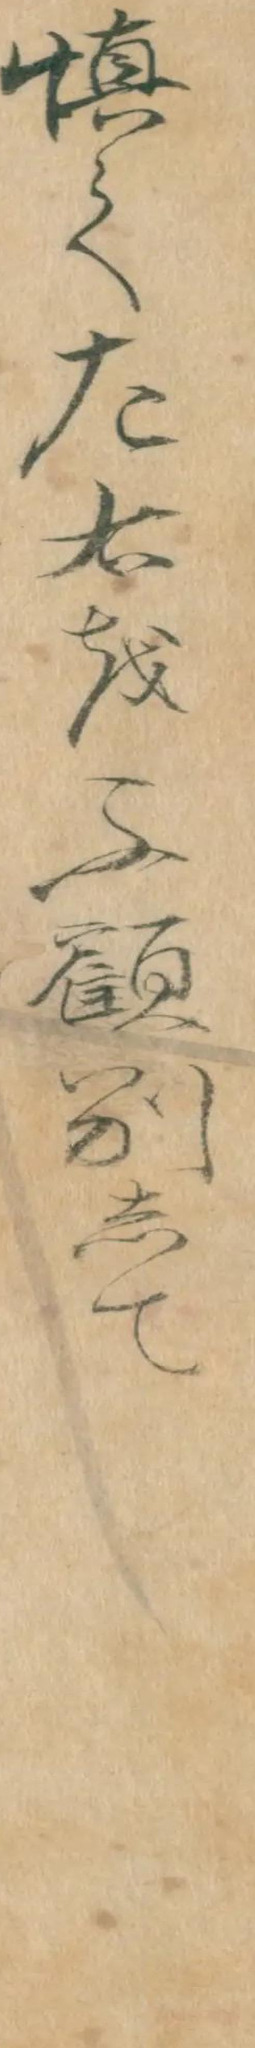慎て左右を不顧別して
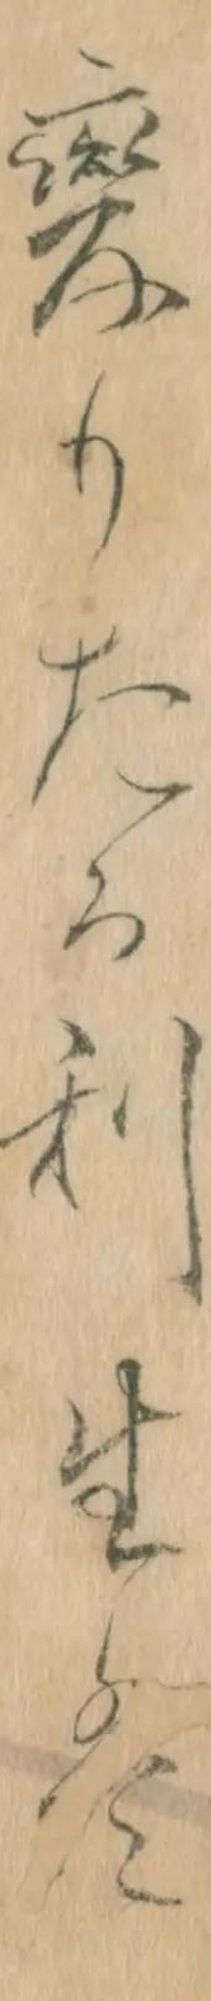變りたる利生は
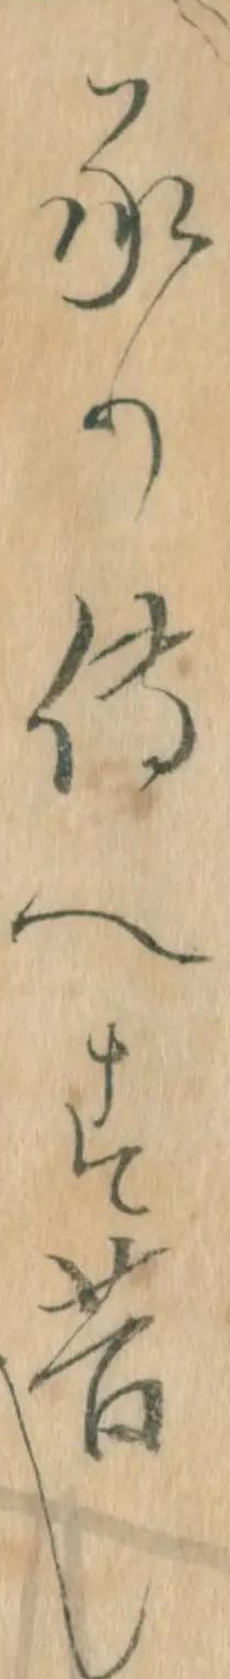承り傳へす昔し
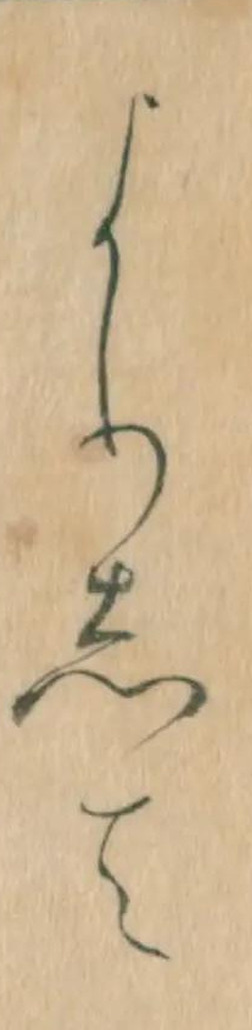よりして
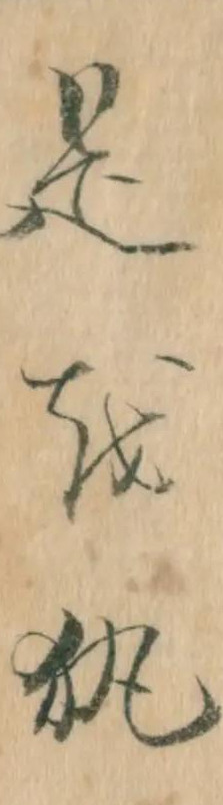是を執
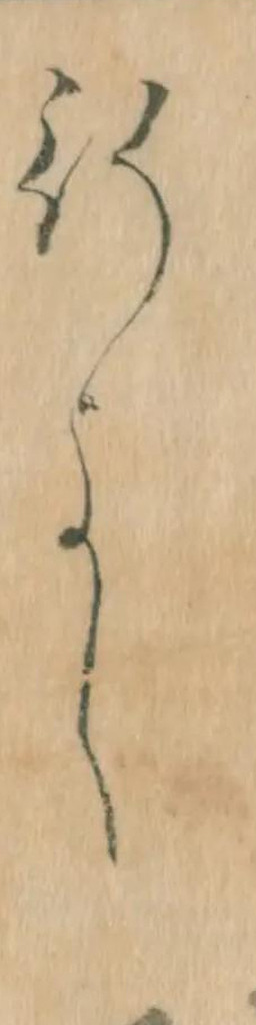行よし
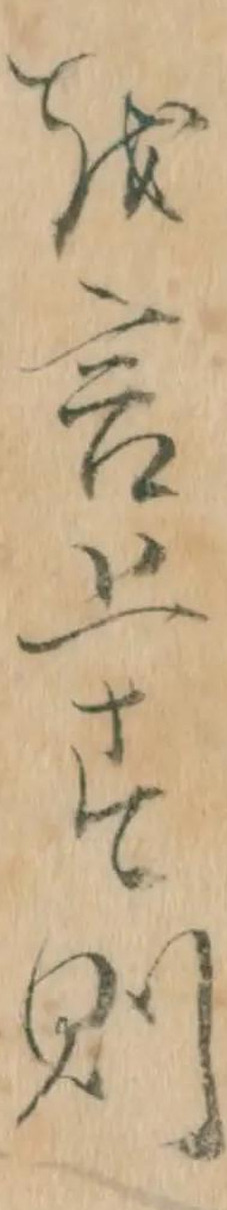を言上す則
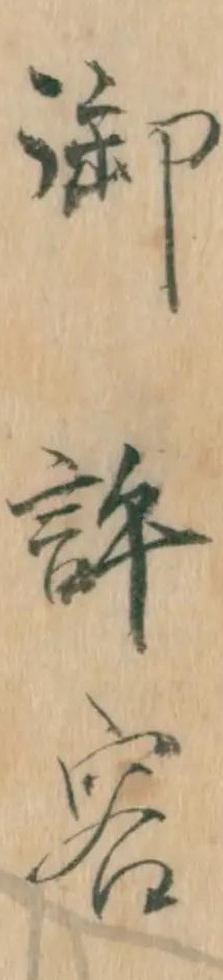御許容
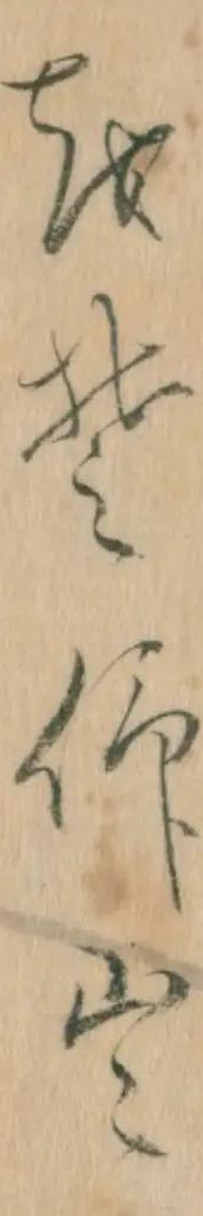をそ仰出
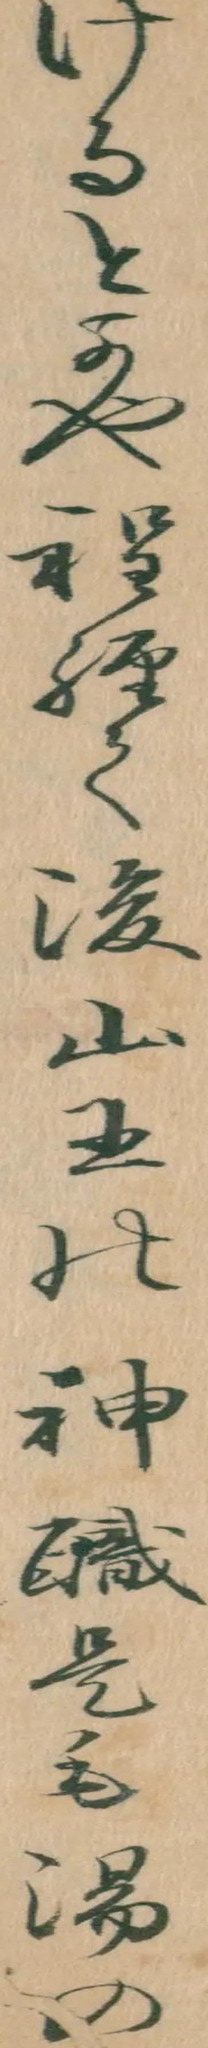けるとかや程経て後山王の神職是も湯の
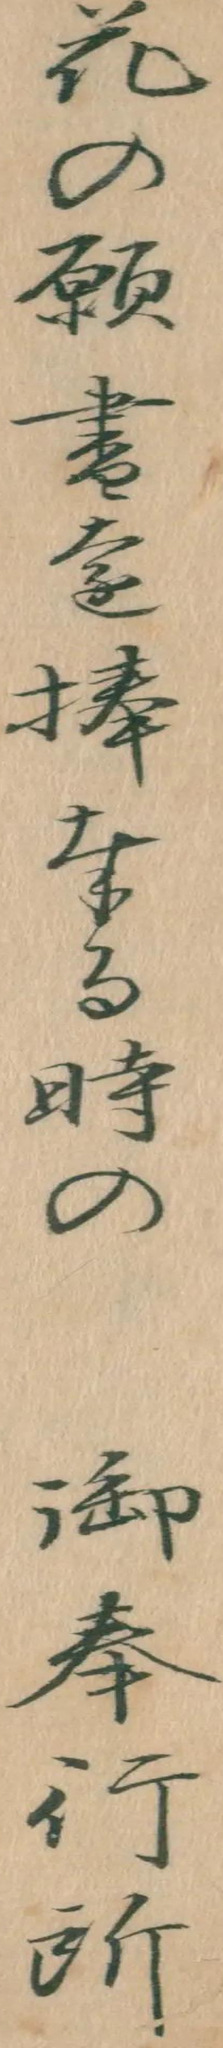花の願書を捧奉る時の御奉行所
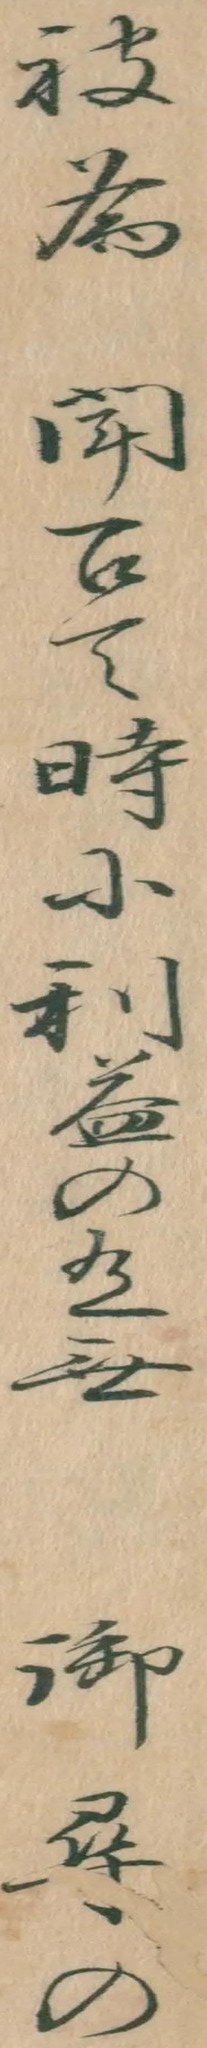被為聞召て時に利益の有無御尋の
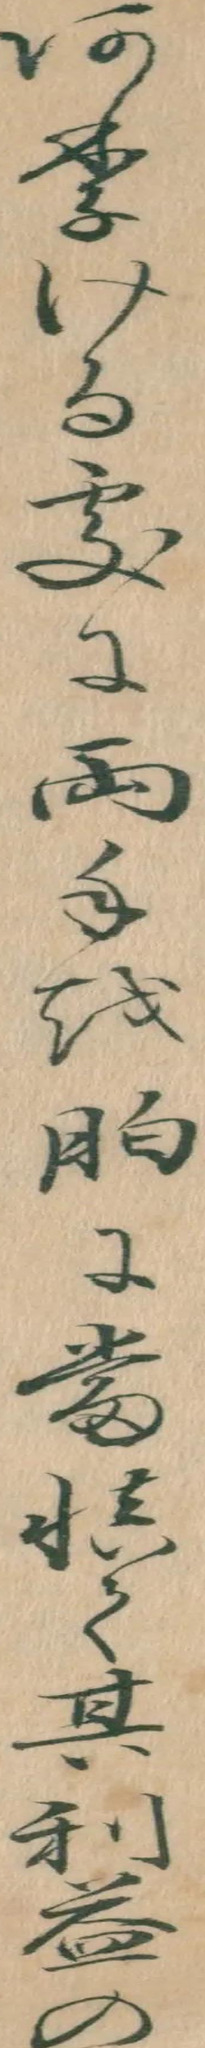ありける處に両手を胸に當慎て其利益の
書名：俗語之種. [7]
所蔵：国立国会図書館 National Diet Library, JAPAN
